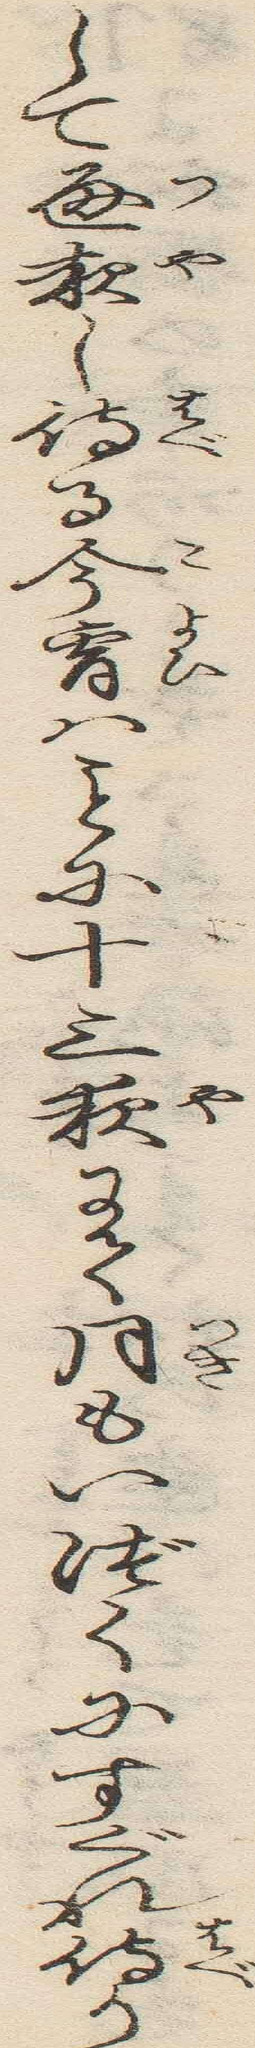して通夜し侍る今宵はことに十三夜にて月もいづくにすぐれ侍り
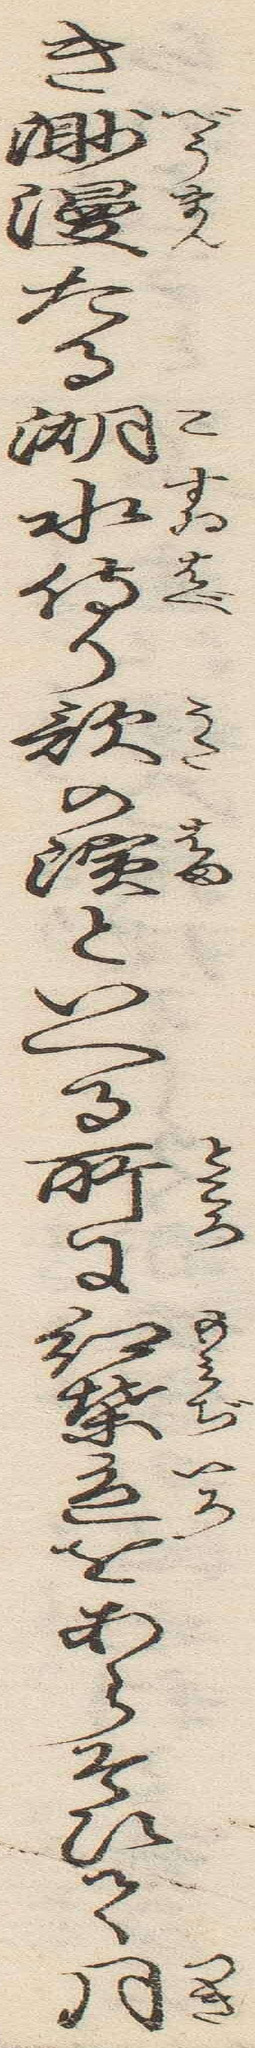き渺漫たる湖水侍り歌の濱といへる所に紅葉色をあらそひて月
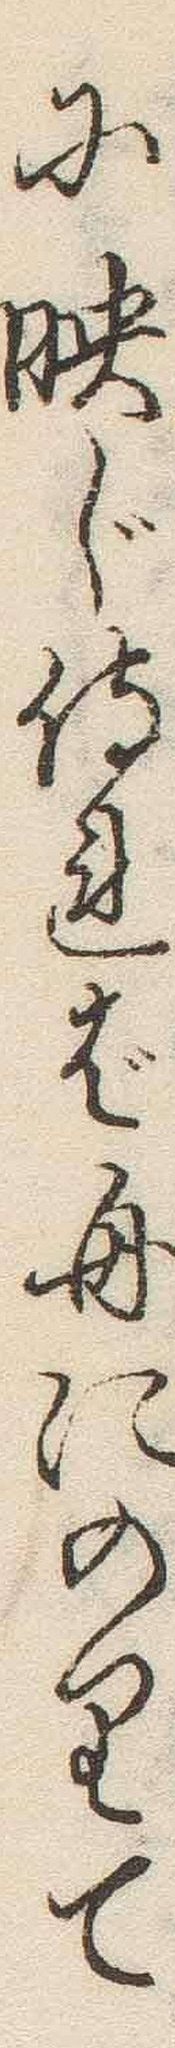に映じ侍れば舟にのりて
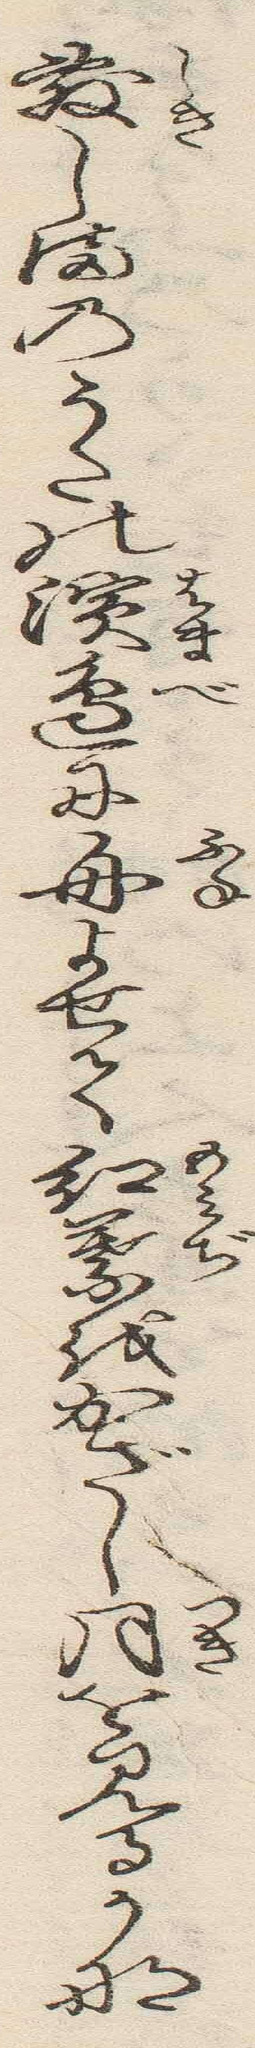敷しまのうたの濱邊に舟よせて紅葉をかざし月を見るかな
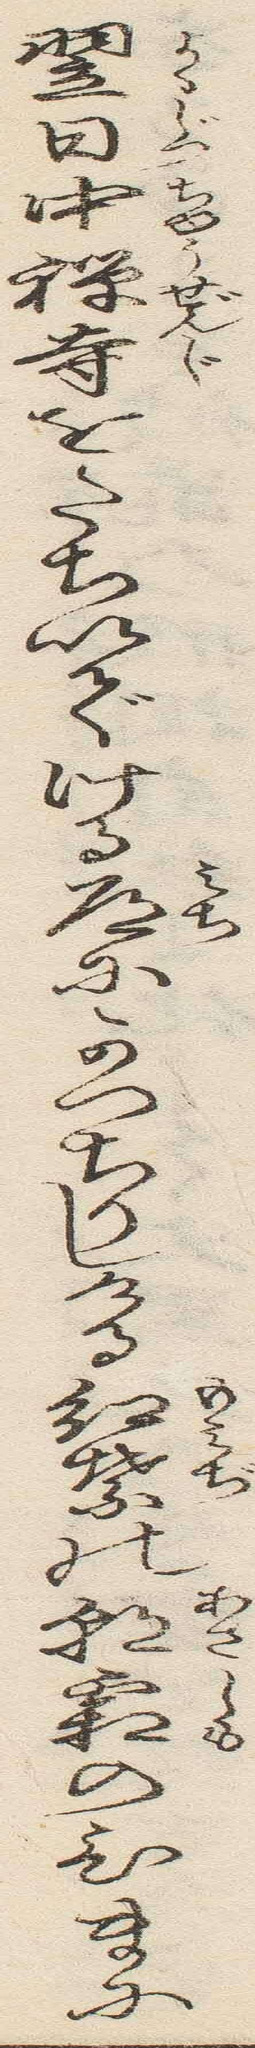翌日中禅寺をたちいでける道にかつちりしける紅葉の朝霜のひまに
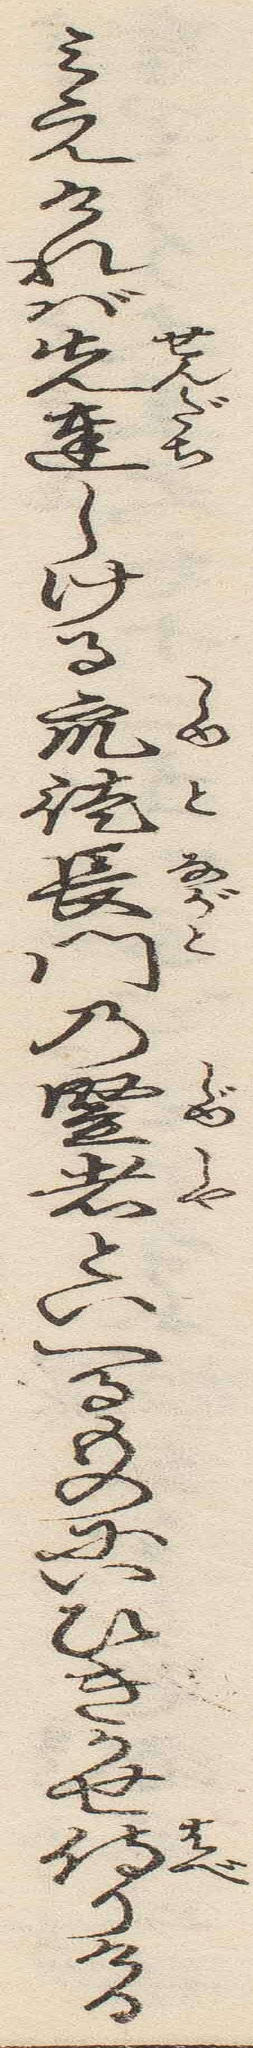みえければ先達しける衆徒長門の竪者といへるものにいひきかせ侍りける
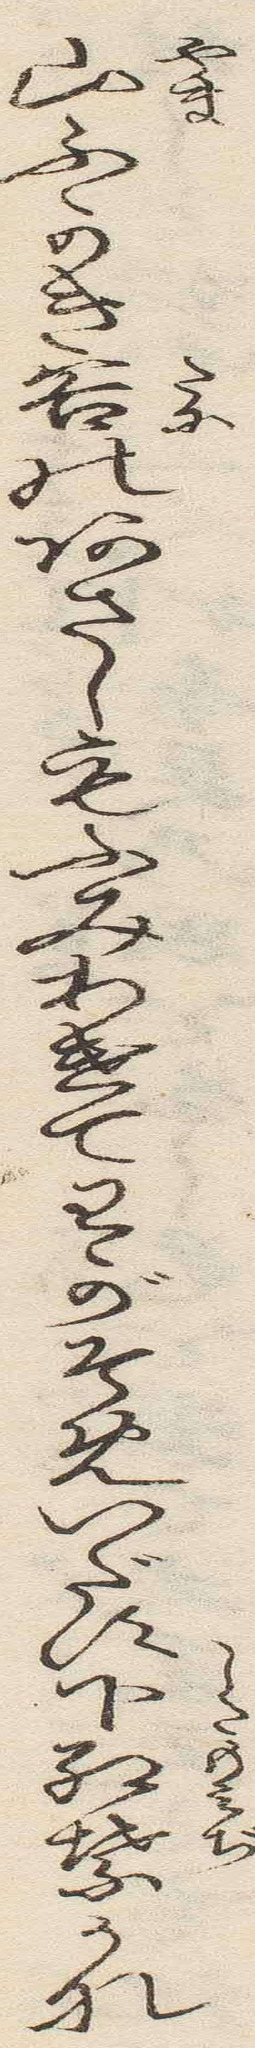山ふかき谷のあさしもふみわけてわがそめいだす下紅葉かな
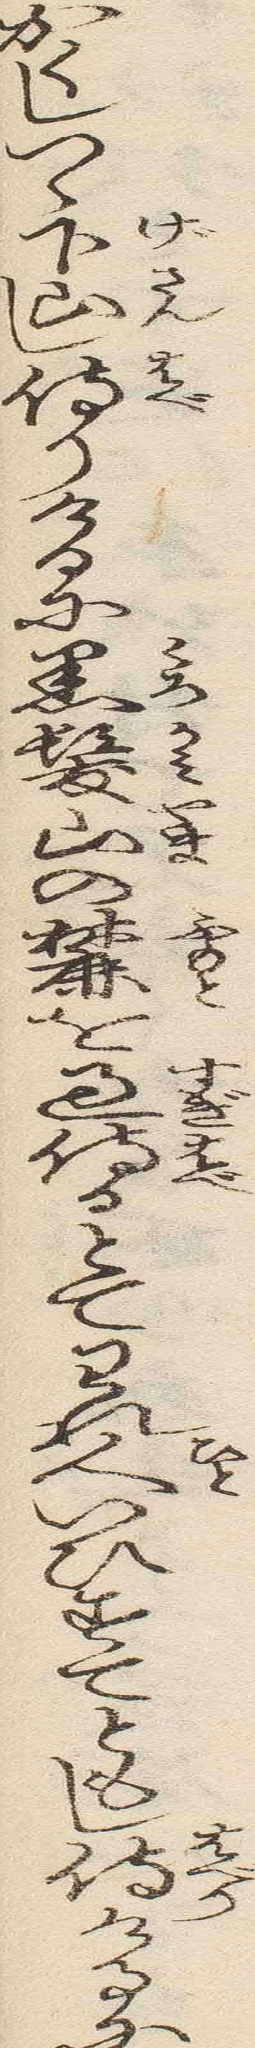かくしつゝ下山し侍りけるに黒髪山の麓を過侍るとてわれ人いひすてともし侍けるに
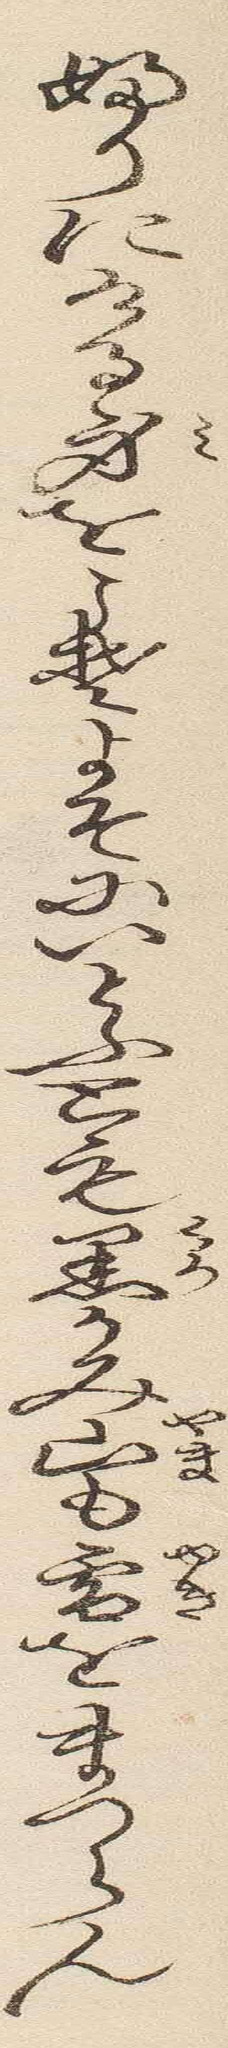ふりにける身をこそよそにいとふとも黒かみ山も雪をまつらん
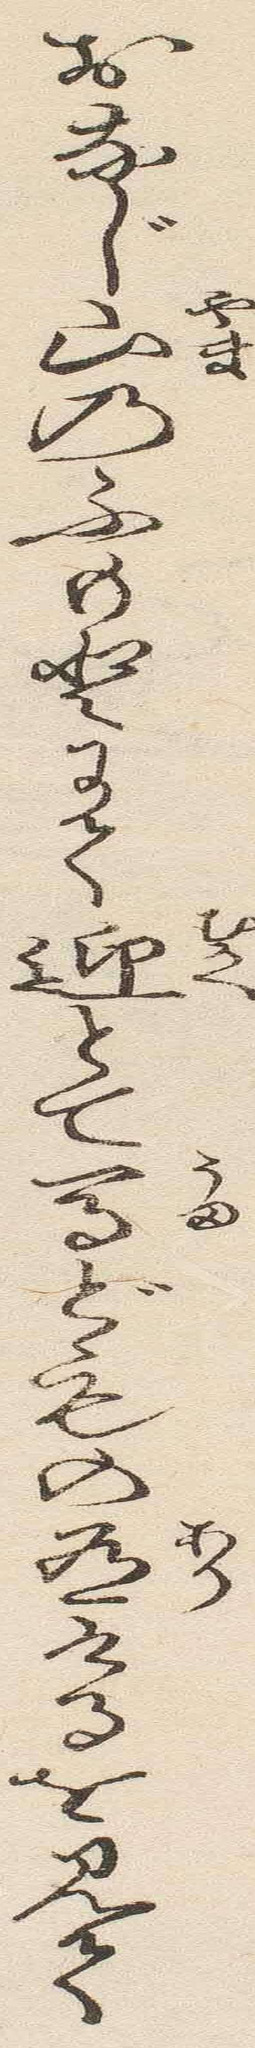おなじ山のふもとにて迎とて馬どもの有けるを見て
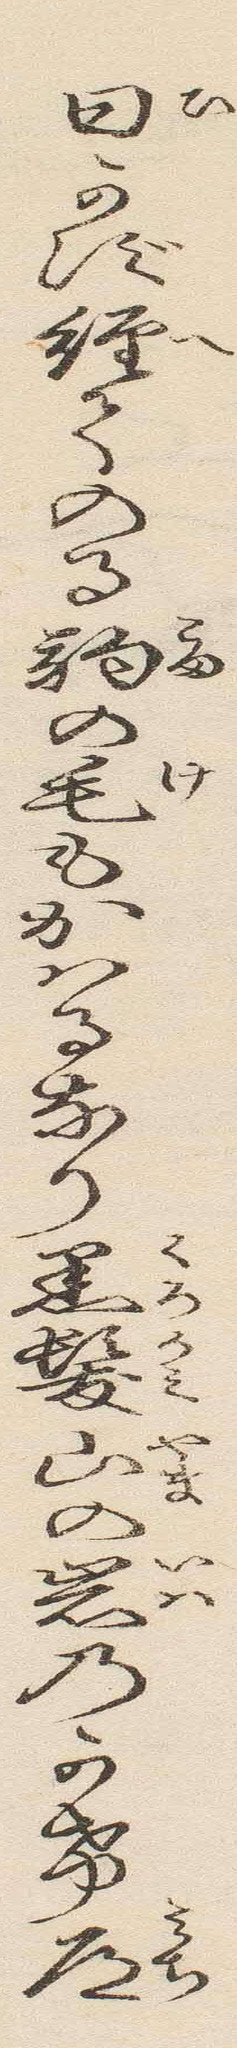日かず經てのる駒の毛もかはるなり黒髪山の岩のかけ道
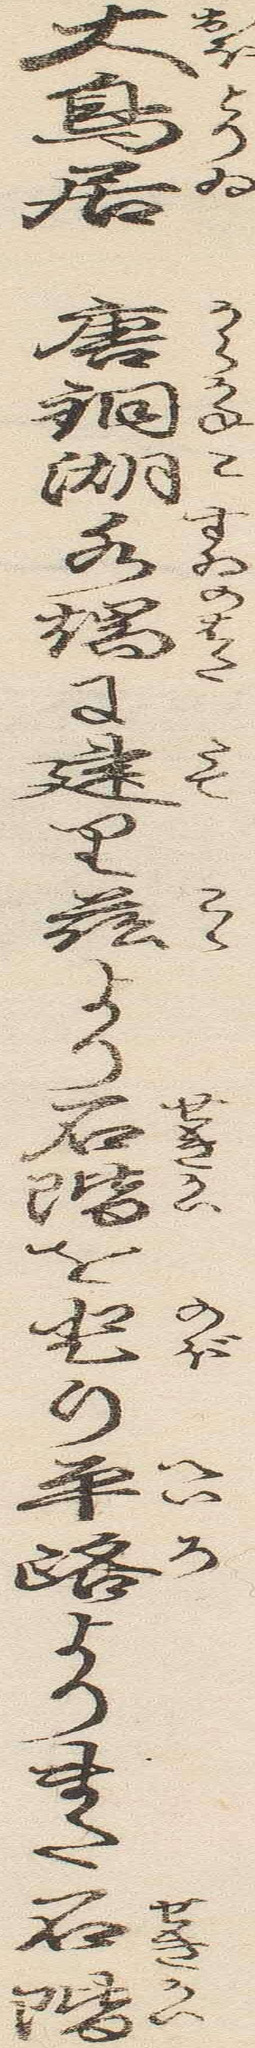大鳥居唐銅湖水端に建り兹より石階を登り平路よりまた石階
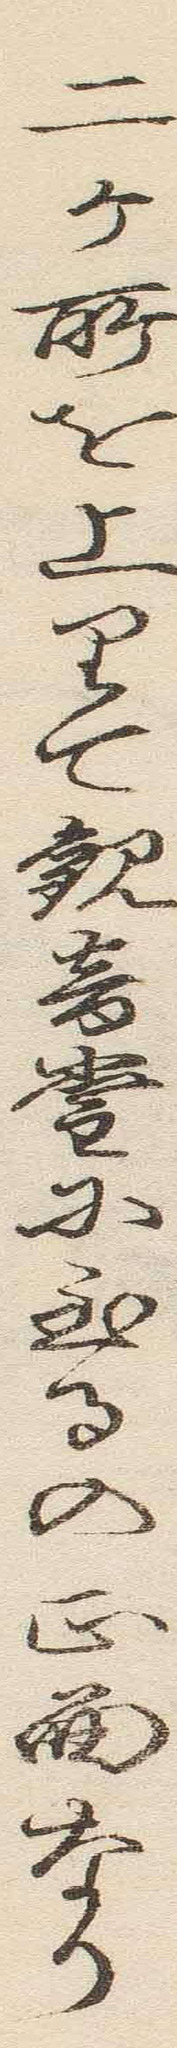二ヶ所を上りて觀音堂に至るの正面なり
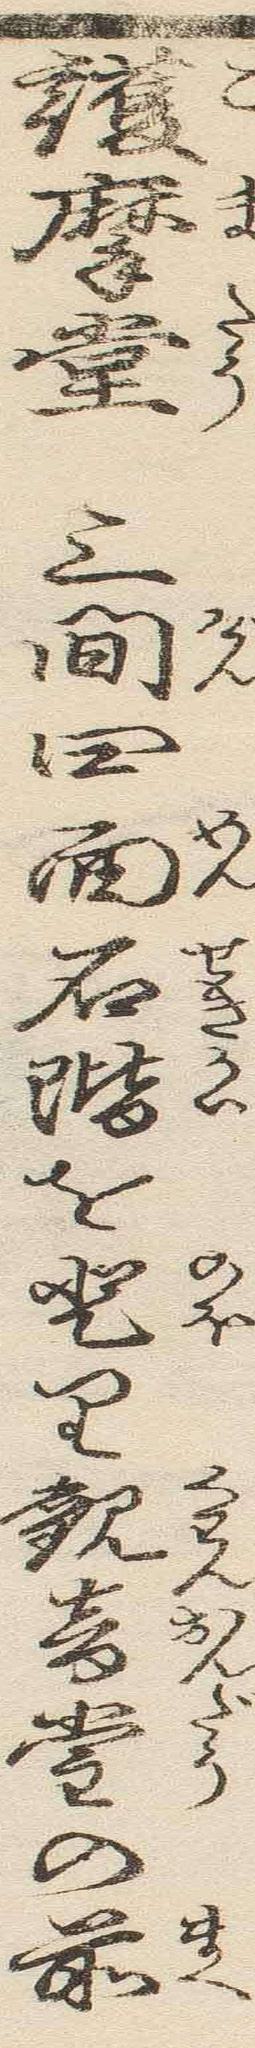護摩堂三間四面石階を登り觀音堂の前
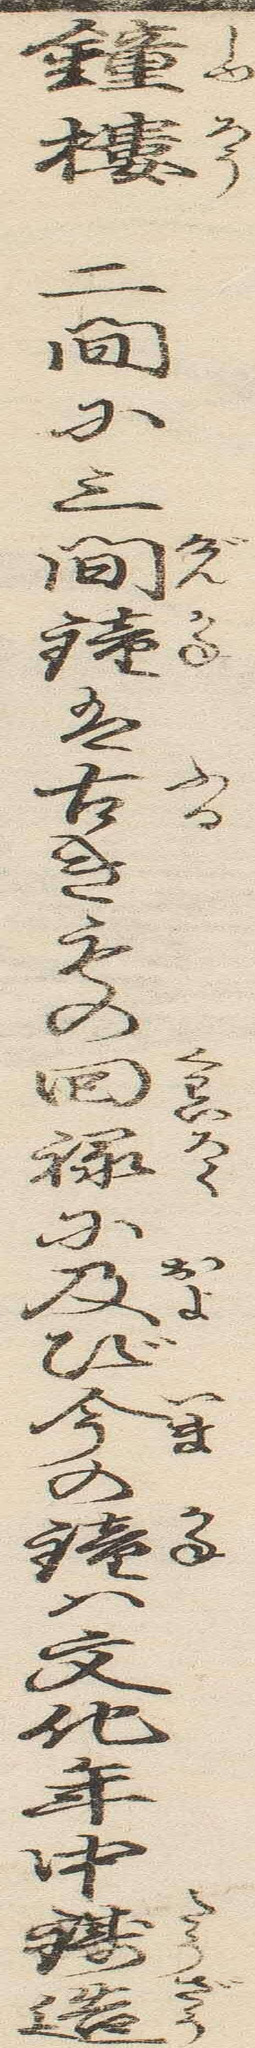鐘楼二間に三間鐘は古きもの囘録に及び今の鐘は文化年中鋳造
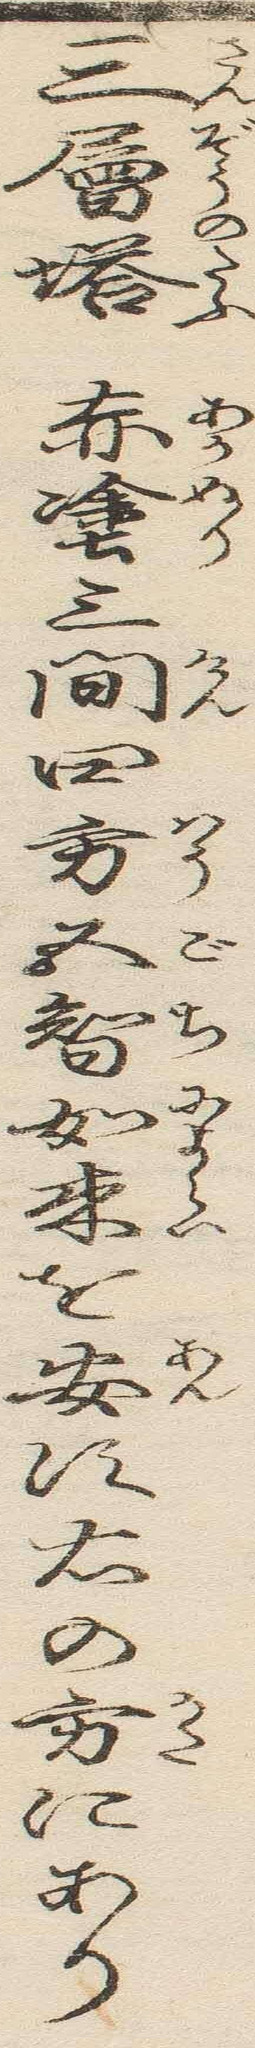三層塔赤塗三間四方五智如來を安す右の方にあり
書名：日光山志
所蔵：東京学芸大学附属図書館 国文学研究資料館
